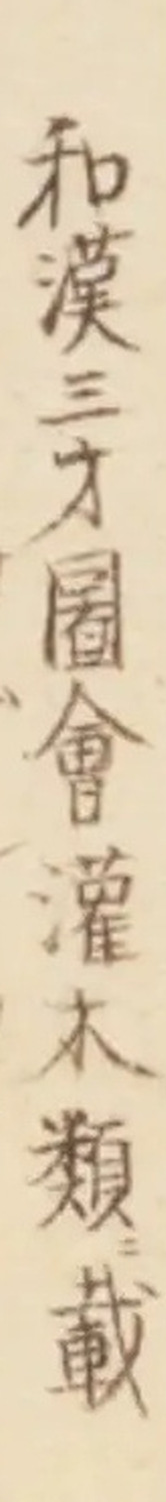和漢三才図会灌木類載
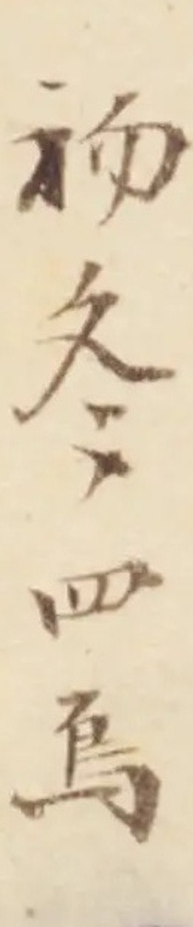初冬四島

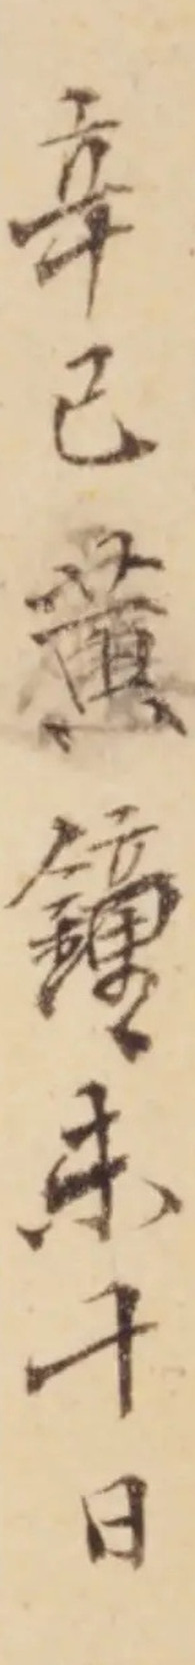辛己木黄鐘末十日
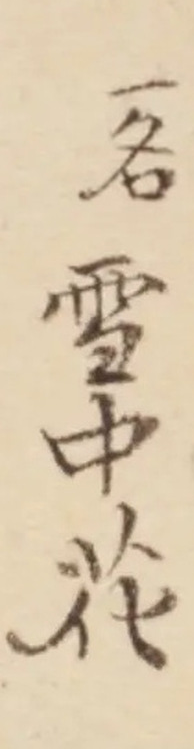一名雪中花
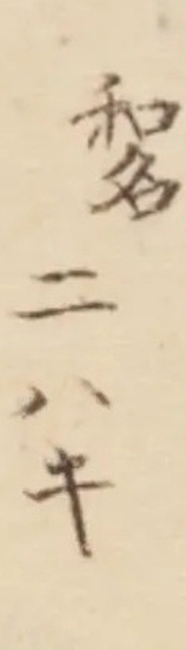和名ニハキ
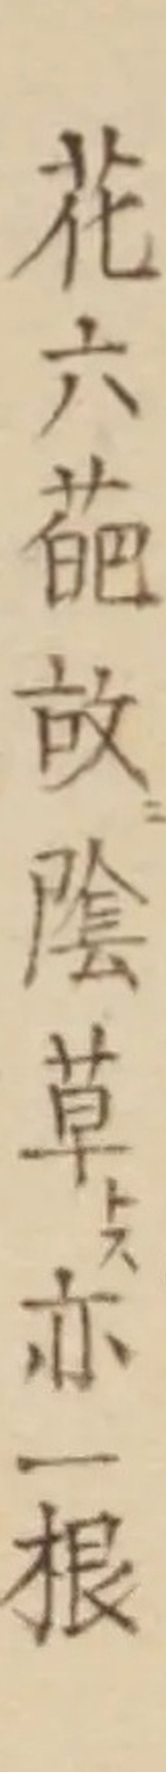花六葩畝陰草亦一根
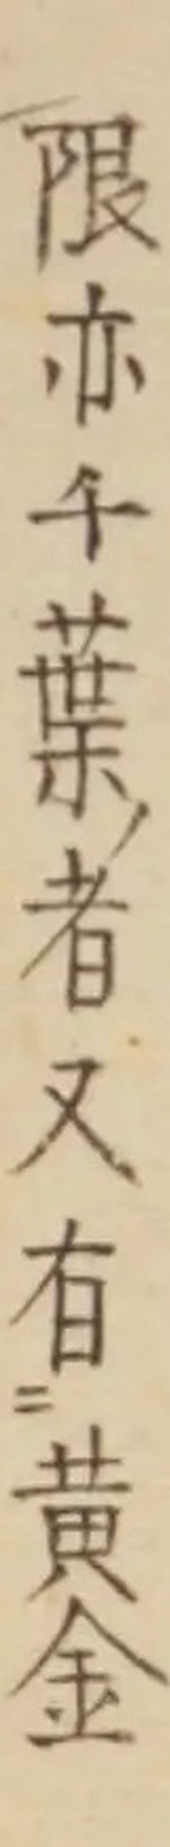限亦千葉者又有黄金

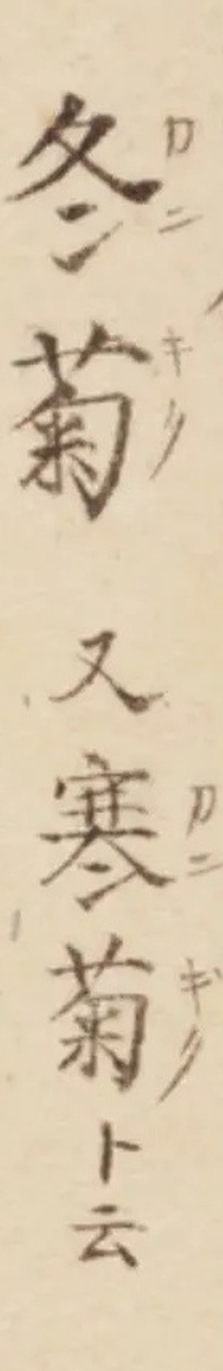冬菊又寒菊ト云
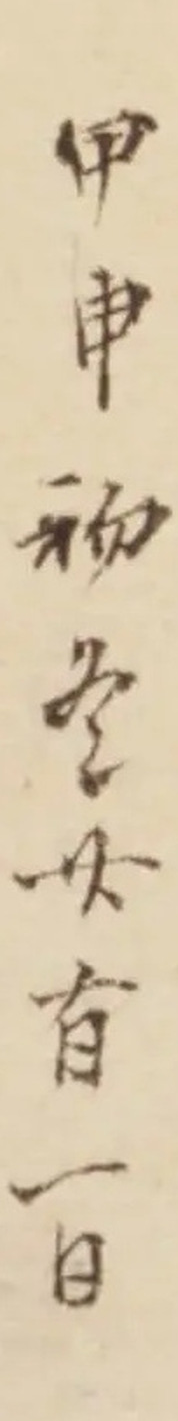甲申初冬廿有一日

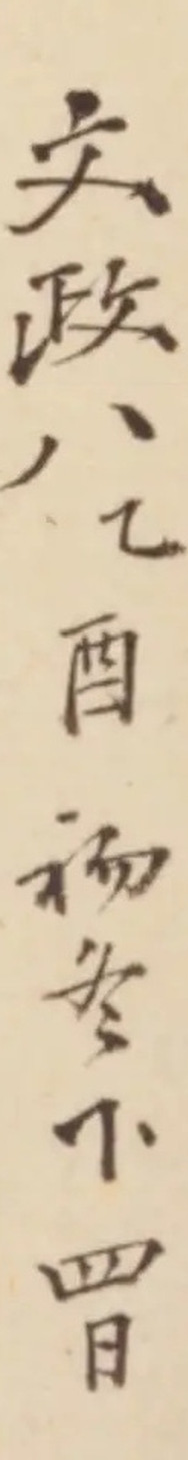文政八乙酉初冬下四日

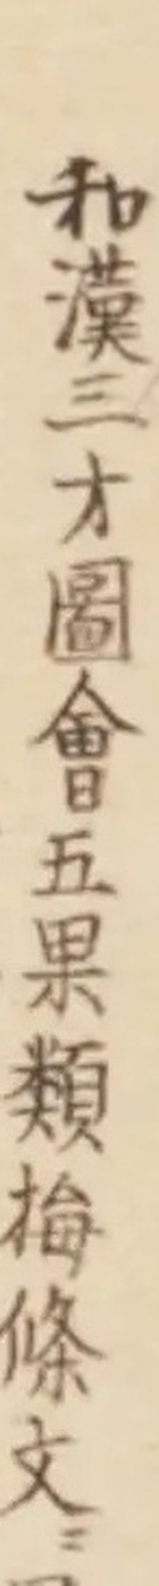和漢三才図会五果類梅條文曰
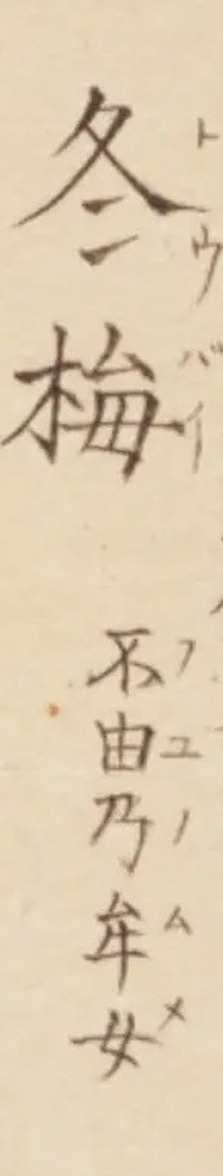冬梅不由乃牟女
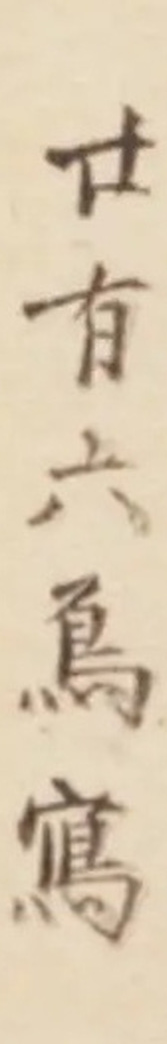廿有六烏写

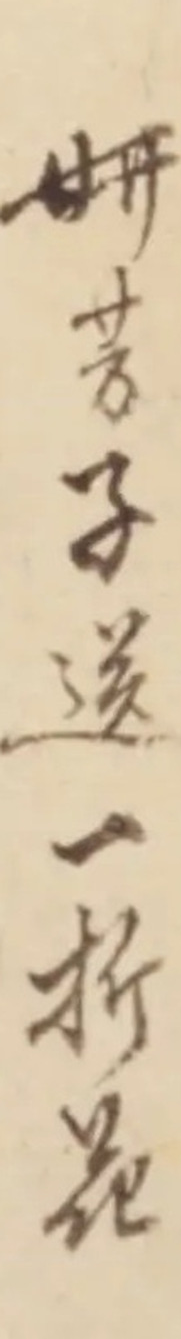妍芳子送一折花
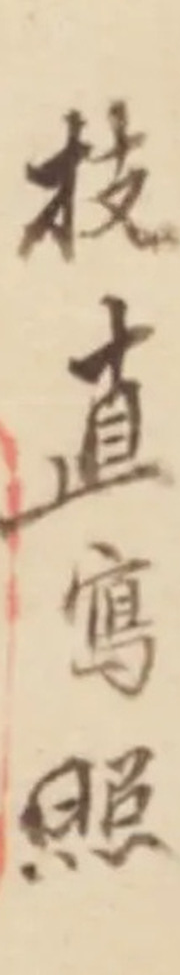枝直写照

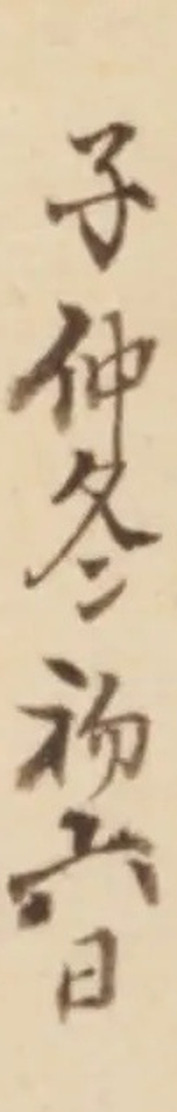子仲冬初六日
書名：梅園草木花譜冬之部
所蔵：国立国会図書館 National Diet Library, JAPAN
